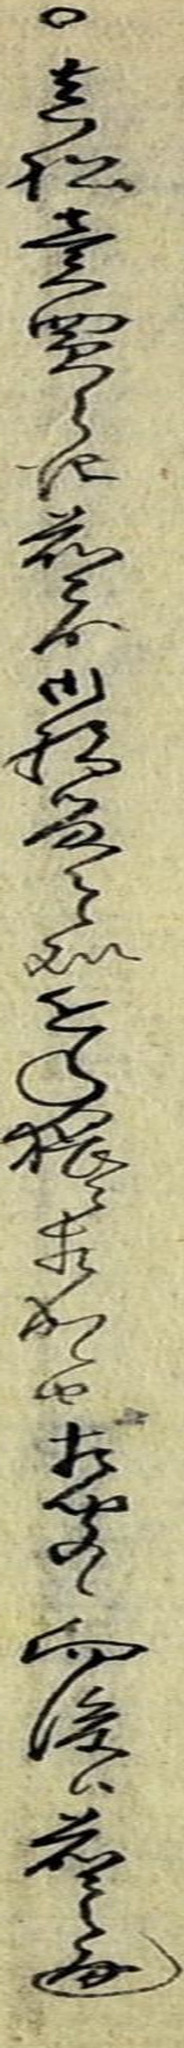○真松売買之儀前々ゟ御指留に候処近年猥に相成候由相聞候向後は前々之通
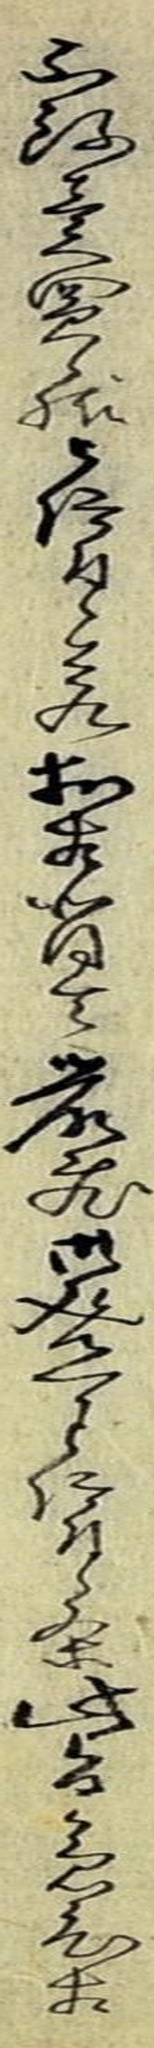不致売買候様被仰付候若於相背は厳敷御咎被仰付候条此旨急度相
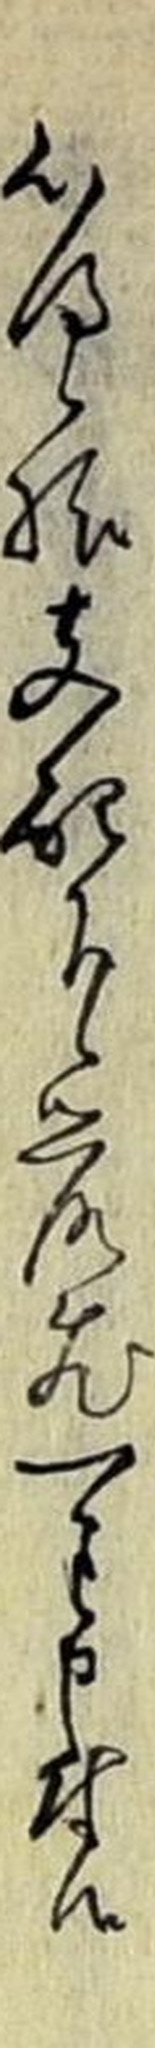心得候様支配下厳敷可被申付候
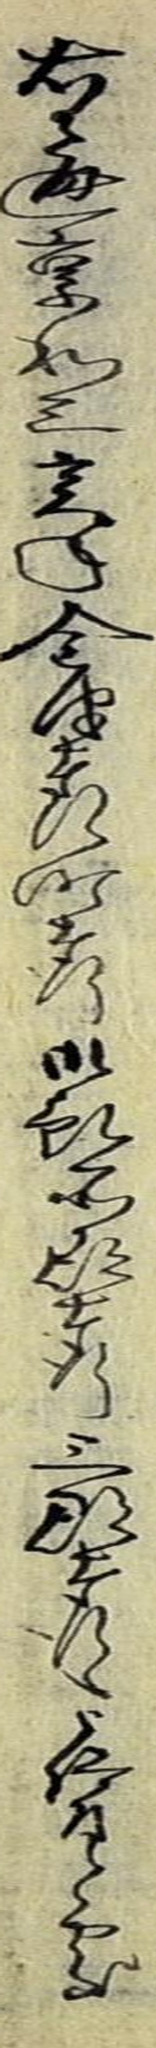右之通享和三亥年金津奉行町奉行御預所郡奉行三郡奉行へ被仰付候処
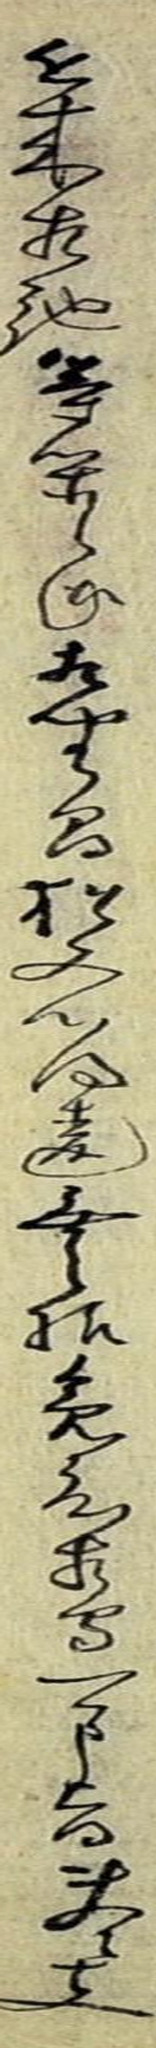近来相弛等閑之趣相聞候間猶亦又心得違無之様急度相守可申旨夫々支
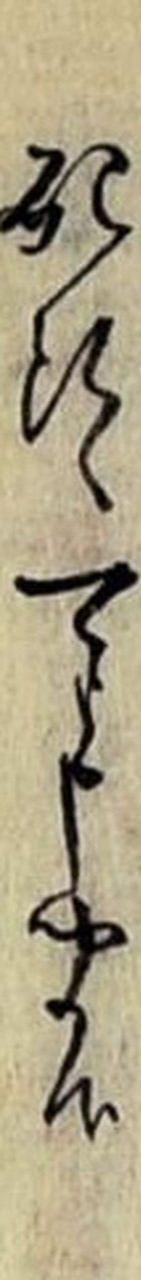配頭へ可被申聞候
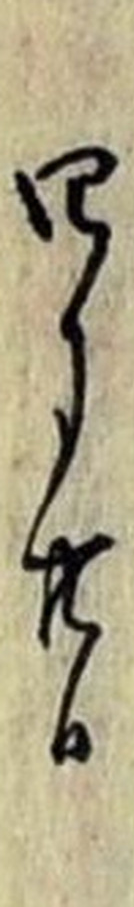四月廿日
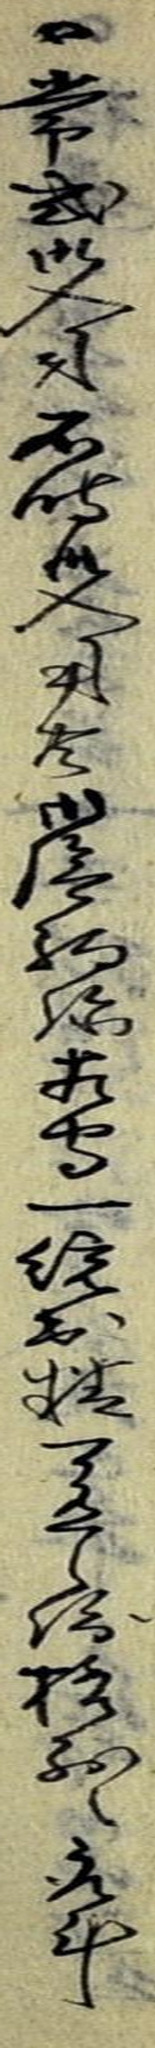○常式御入用不時御入用共御倹約弥相守一統出精有之儀格別之取斗
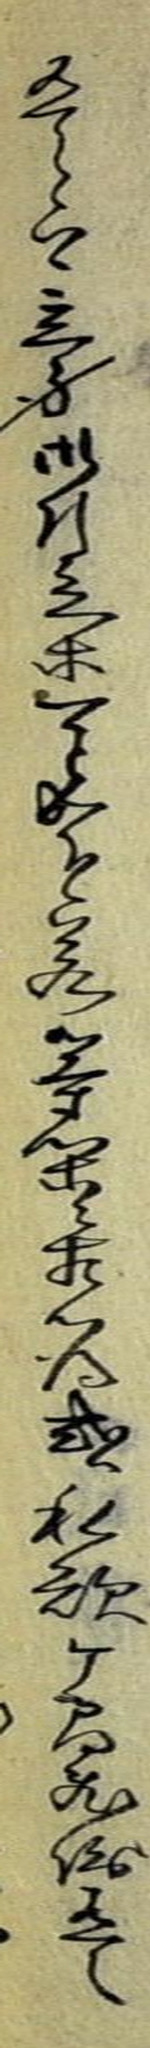有之候はヽ立身御引立等可被成下候若等閑に相心得或は私欲ヶ間敷儀有之
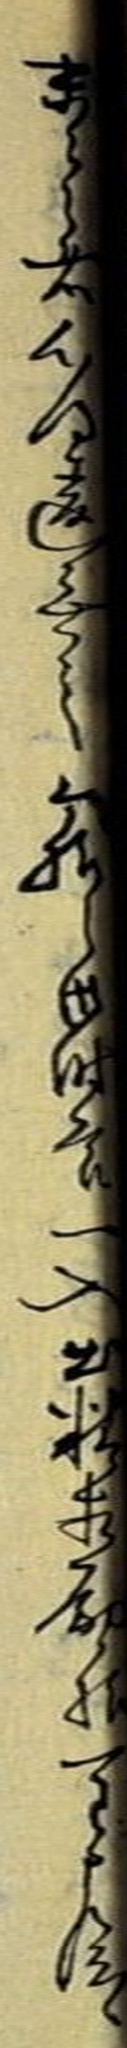末々之者心得違無之ヶ様之御時節一入出精相勤候様可被申渡候
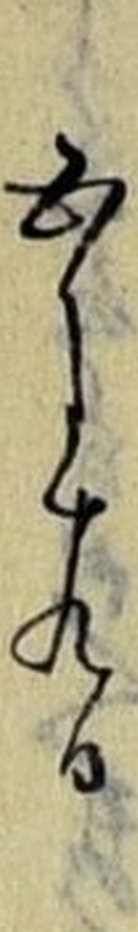五月十九日
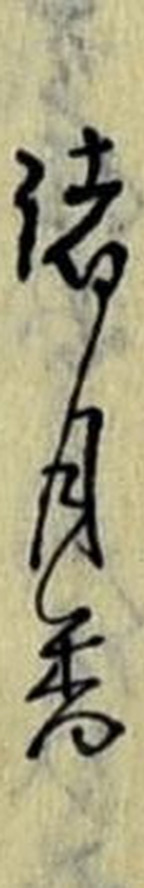諸月番
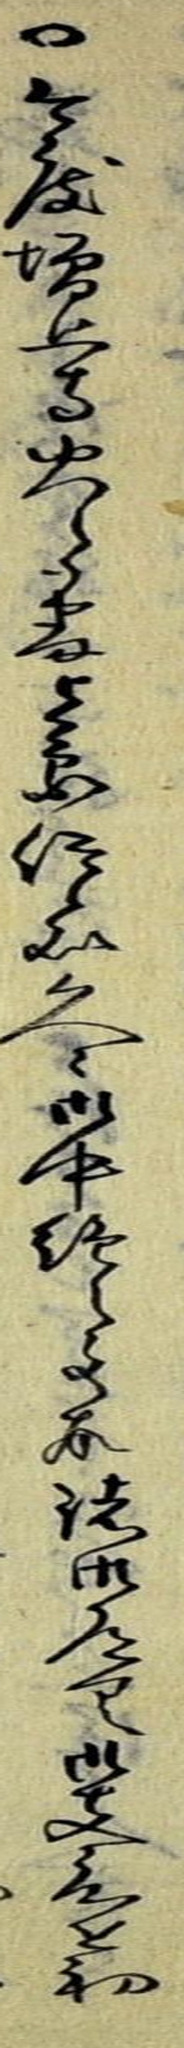○今度増上寺火之御番被蒙仰候処久々御中絶之事故諸御道具御支度を初
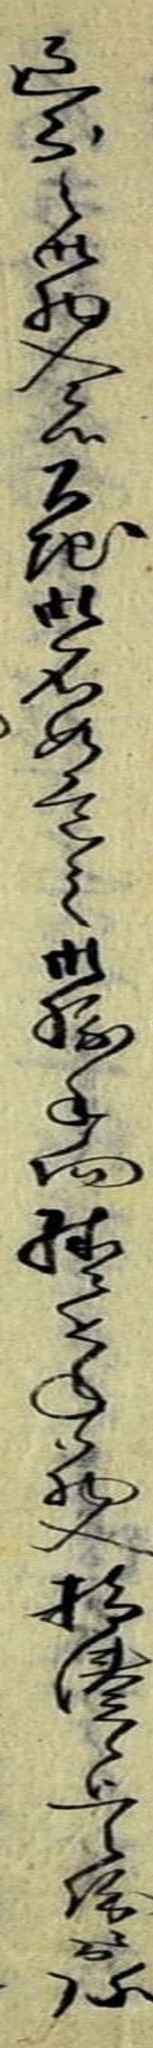過分之御物入に候下地御不如意に候御勝手向殊に近年御物入指湊候上之儀に而弥
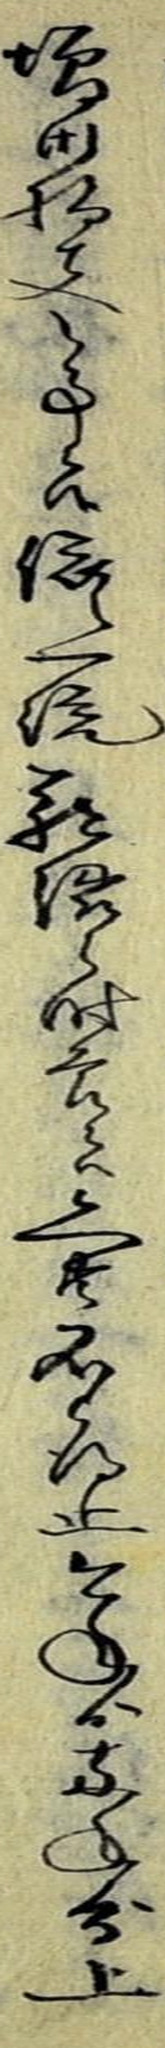増御指支之御事に候依之一統難渋之時節に候へ共不被得止今年ゟ両年分上
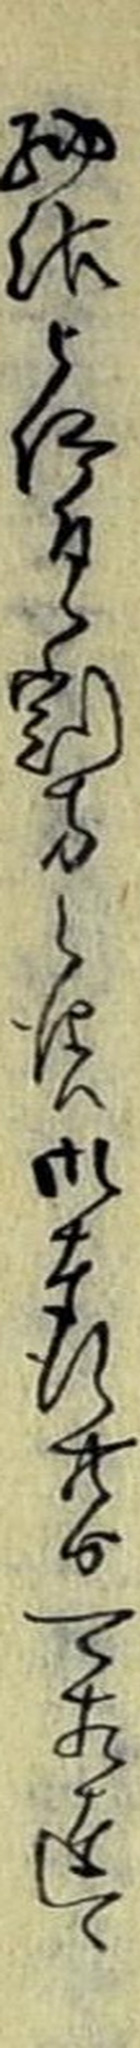納銀被仰付候割方之儀は御奉行共ゟ可相達候
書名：命令之部 四
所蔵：福井県文書館 Fukui Prefectural Archives
